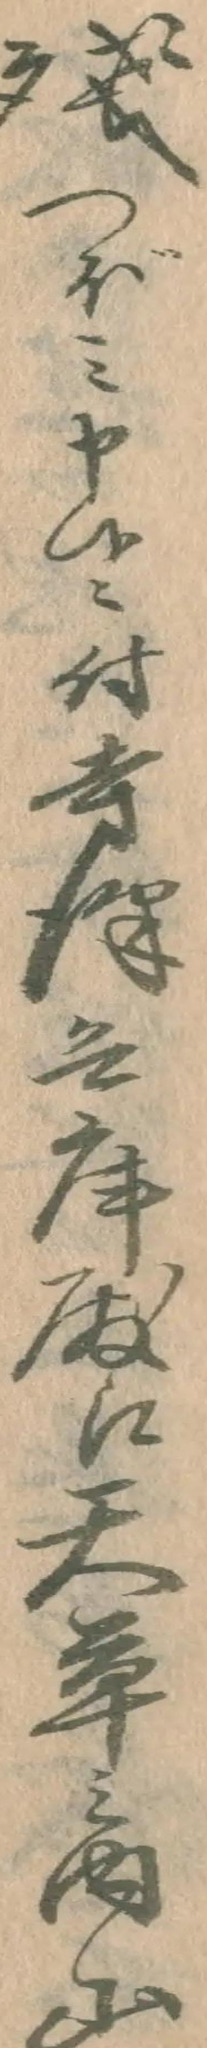残つぼみ申候に付寺沢兵庫殿江天草之内山
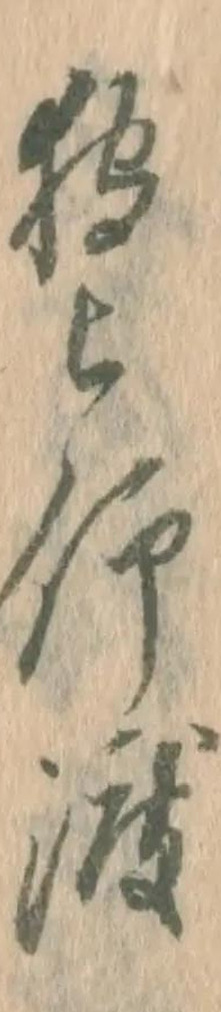狩被仰渡
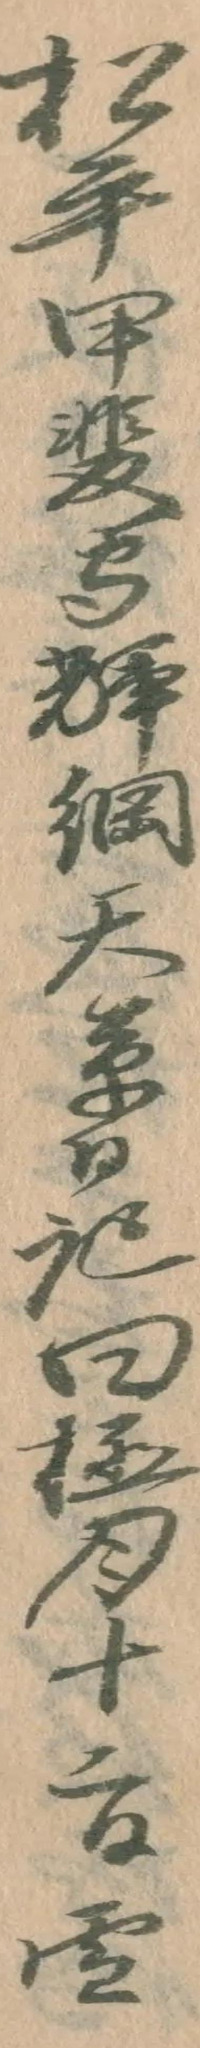松平甲斐守輝綱天草日記曰極月十二日雪
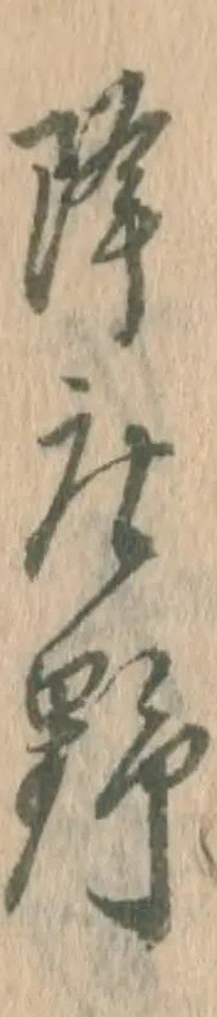降庄野
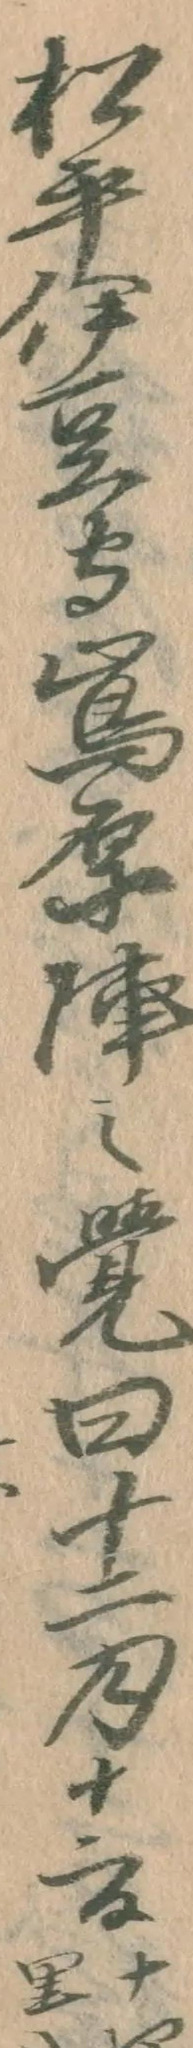松平伊豆守島原陣之覚曰十二月十二日十四里八
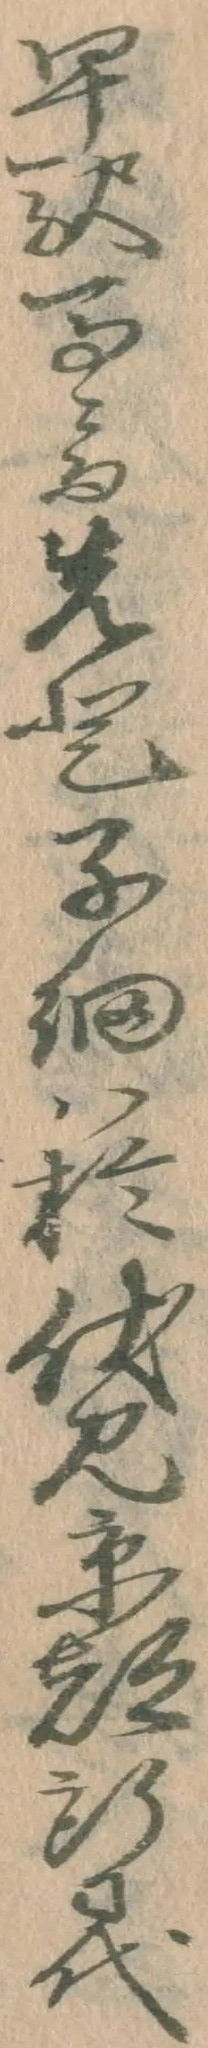早駅馬に而先登子細は於伏見京都所司代
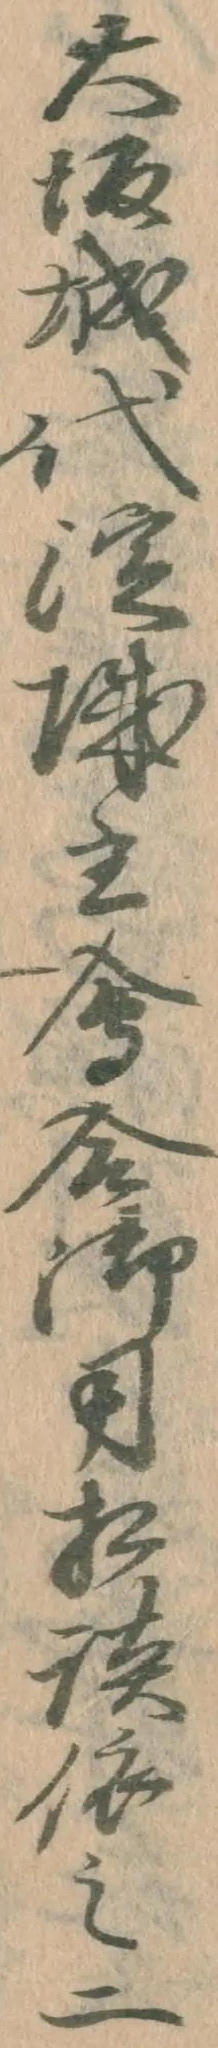大坂城代浜城主会合御用相談依之二
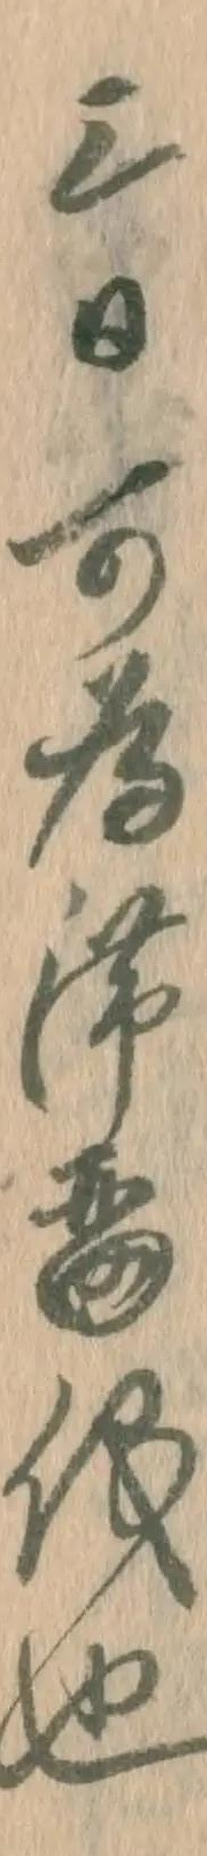三日可為滞留儀也
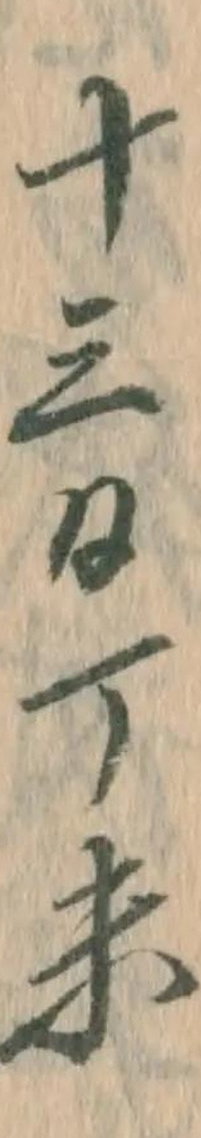十三日丁未
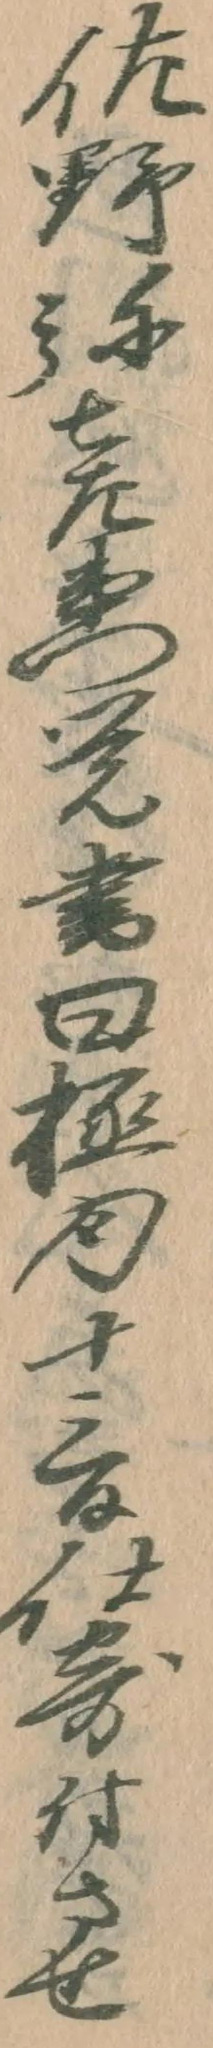佐野弥七左衛門覚書曰極月十三日仕寄付させ
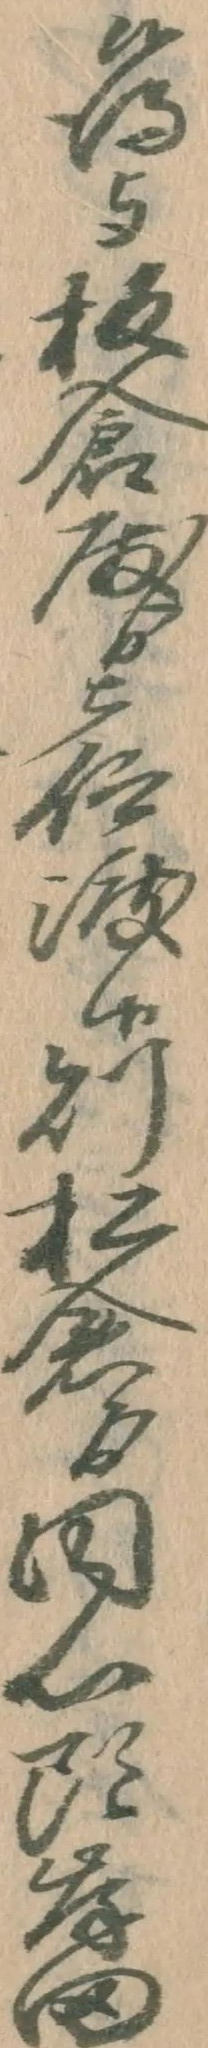候得与板倉殿ゟ被仰渡候則松倉ゟ同心頭岸田
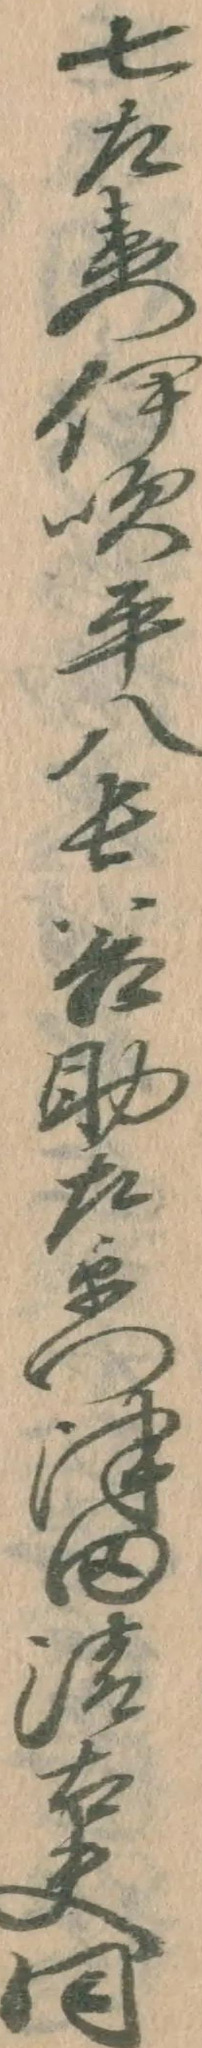七左衛門伊吹平八長谷助左衛門津田清太夫同
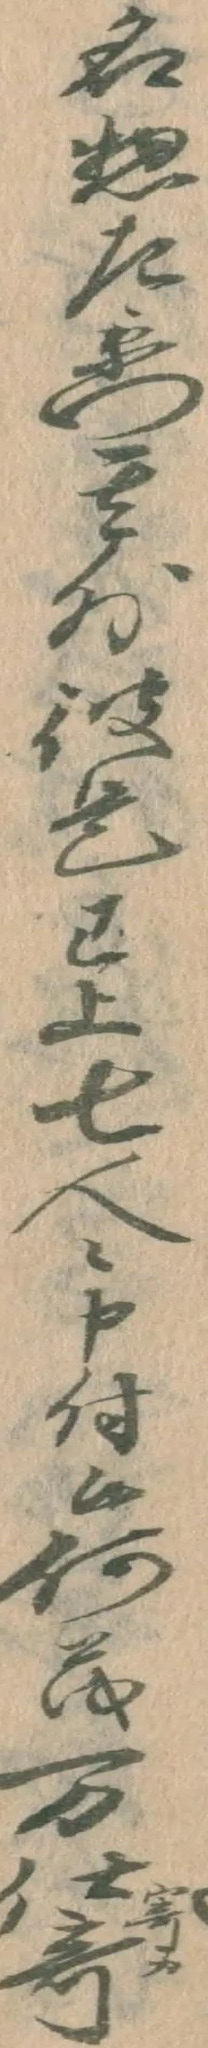名惣左衛門其外彼是已上七人に申付候何茂万仕寄
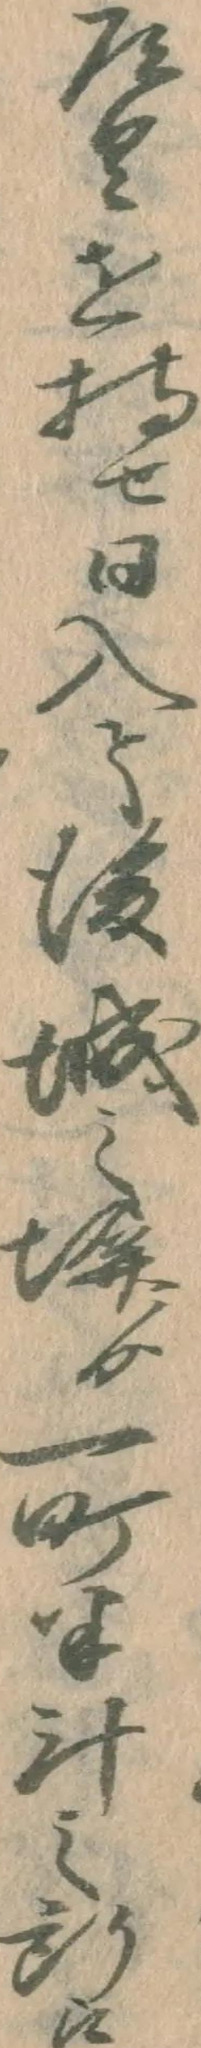道具を持せ日入て後城之塀ゟ一町半斗之所江
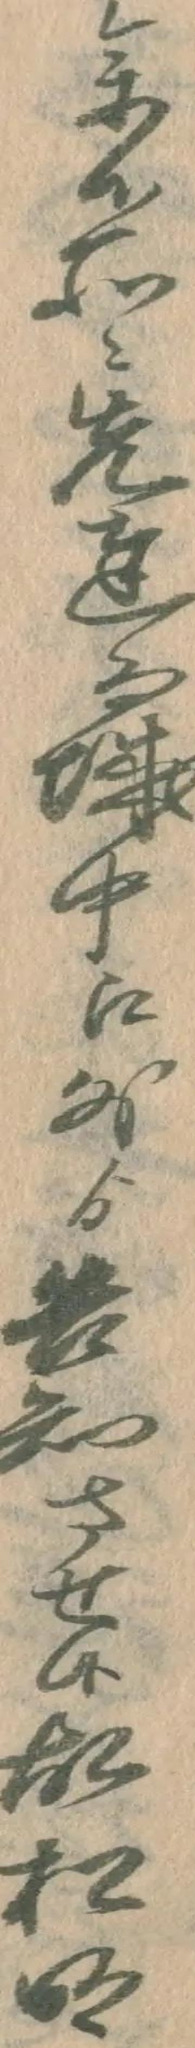参候所に先達而城中江外ゟ告知させ候故松明
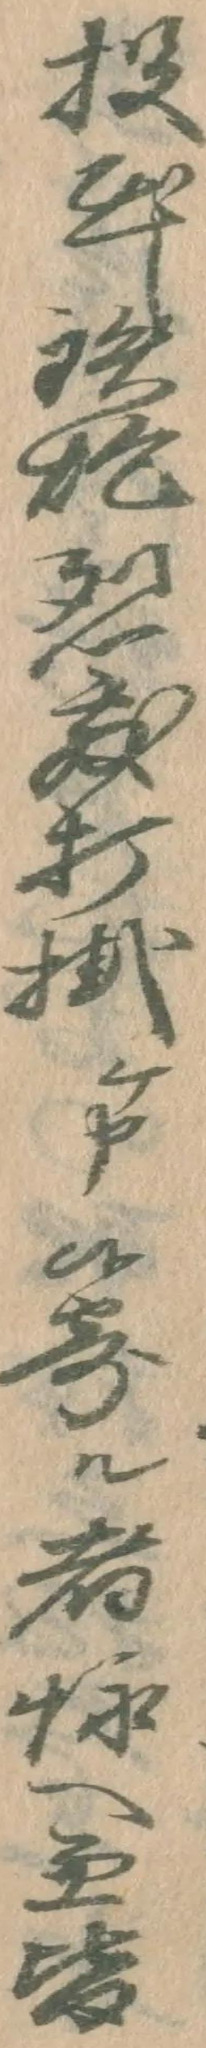投出し鉄炮烈敷打掛け申候寄る者怺へ兼皆
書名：切支丹御退治記 49巻. [4]
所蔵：国立国会図書館 National Diet Library, JAPAN
